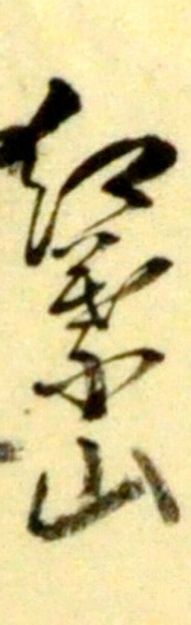紅葉山
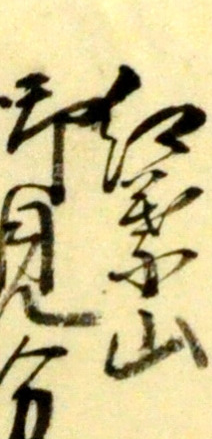紅葉山
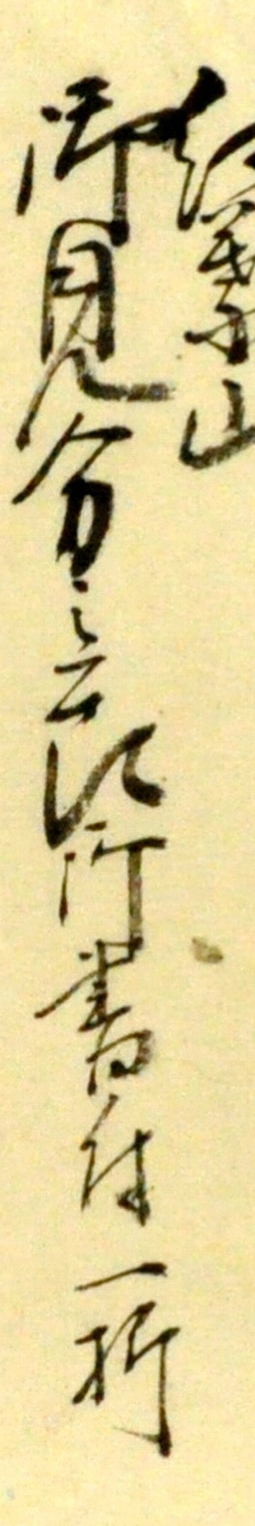御見分之節御書付一折

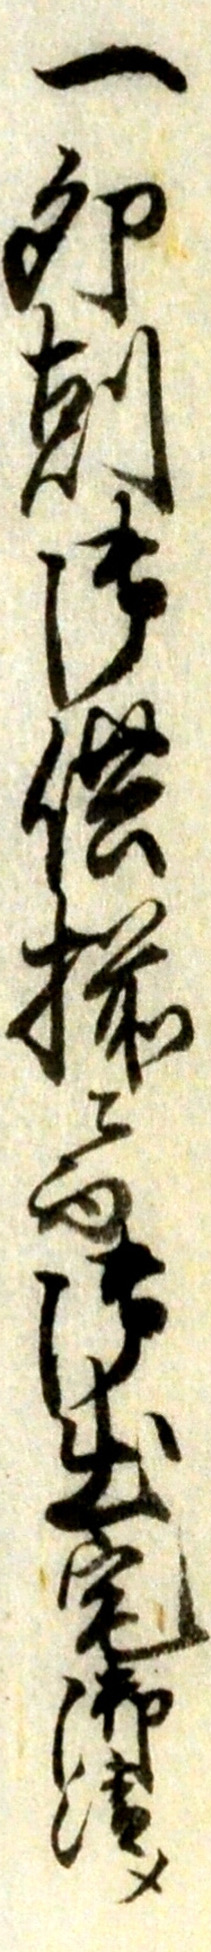一卯刻御供揃ニ而御出宅御清メ
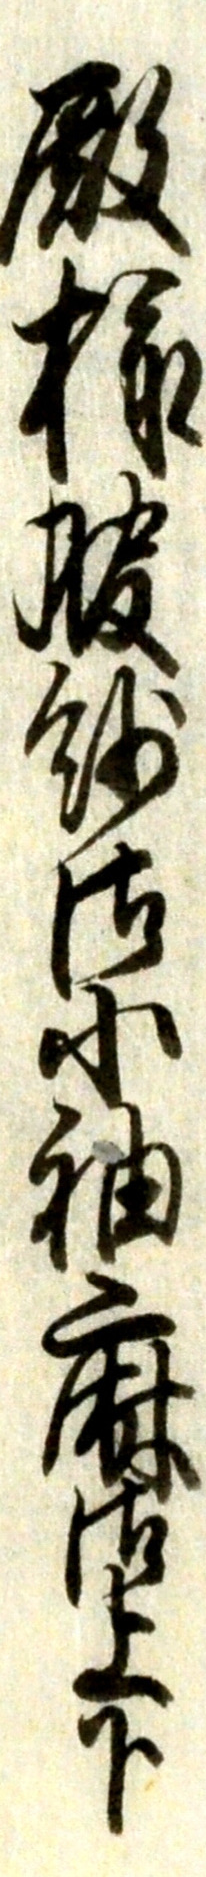殿様服紗御小袖麻御上下
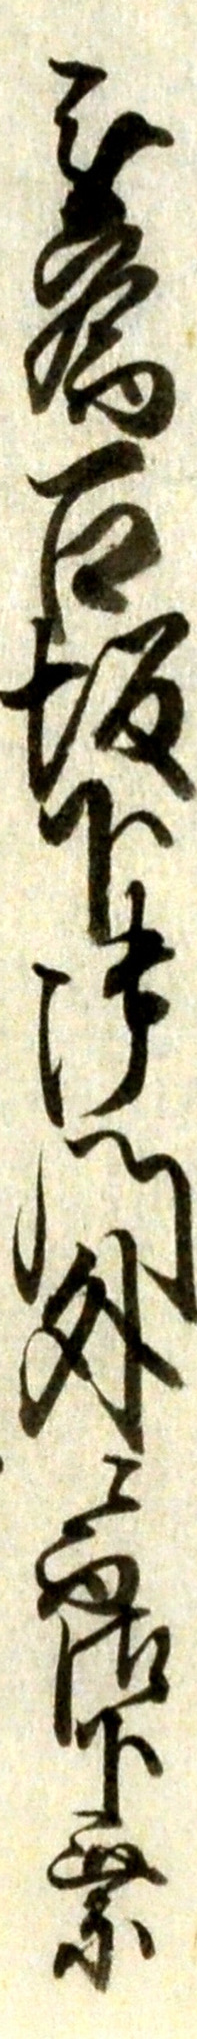被為召坂下御門外ニ而御下乗
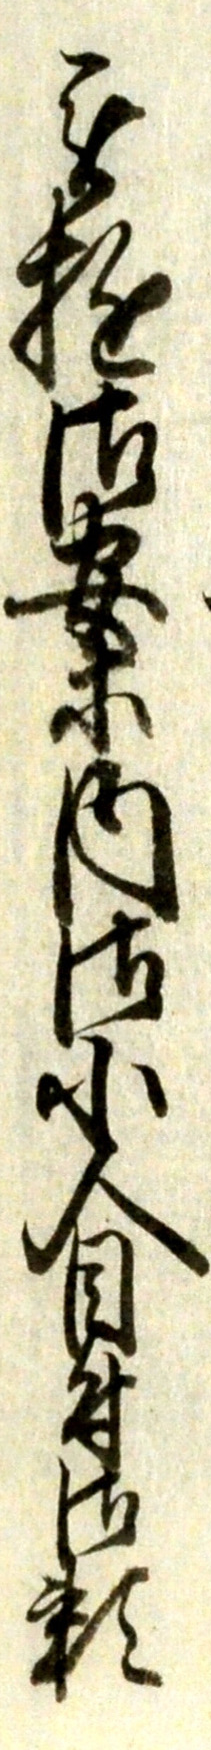被遊御案内御小人目付御頼
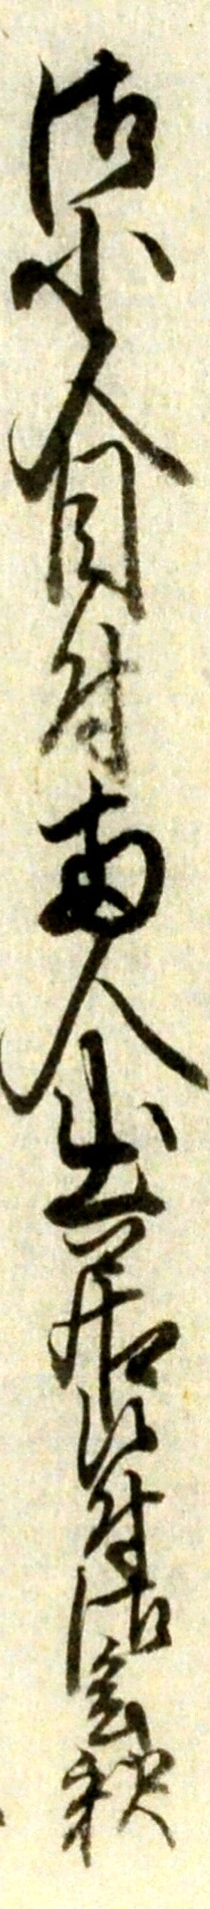御小人目付両人出居候付御会釈
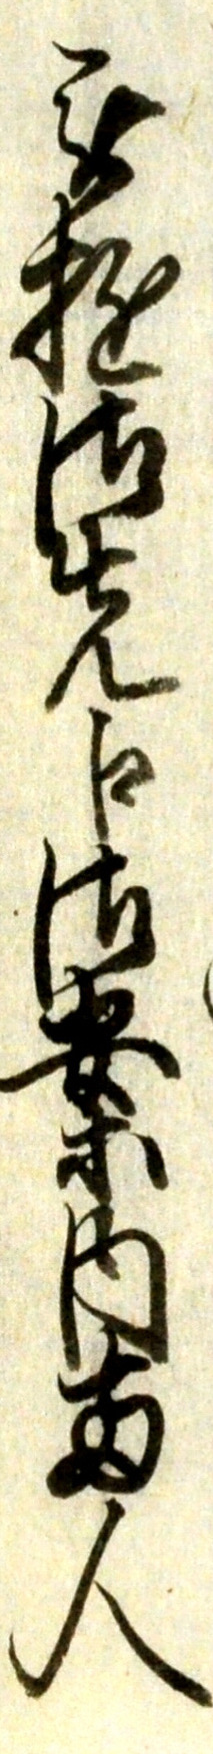被遊御先え御案内両人
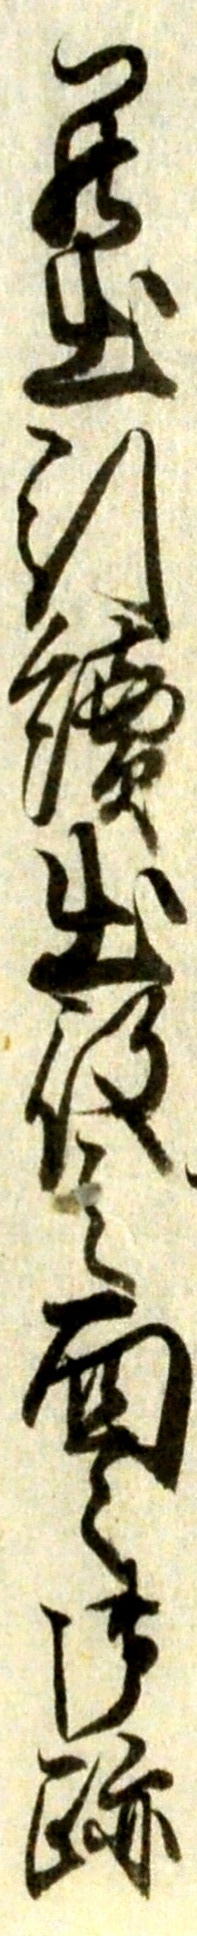罷出引続出役之面々御跡
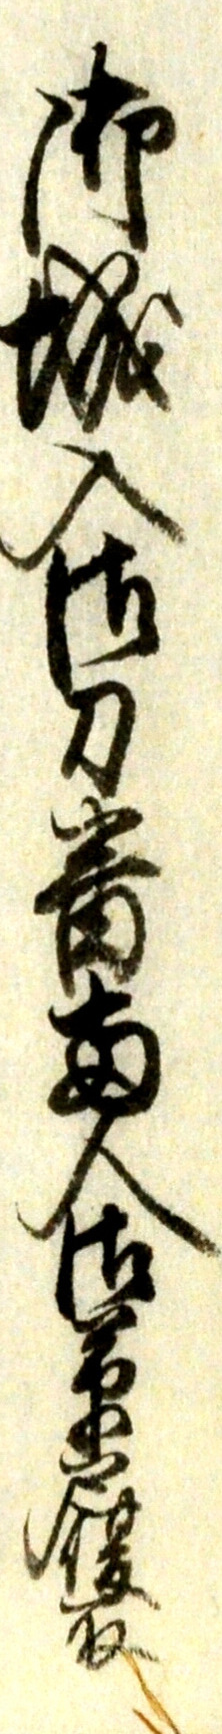御城入御刀番両人御草履取
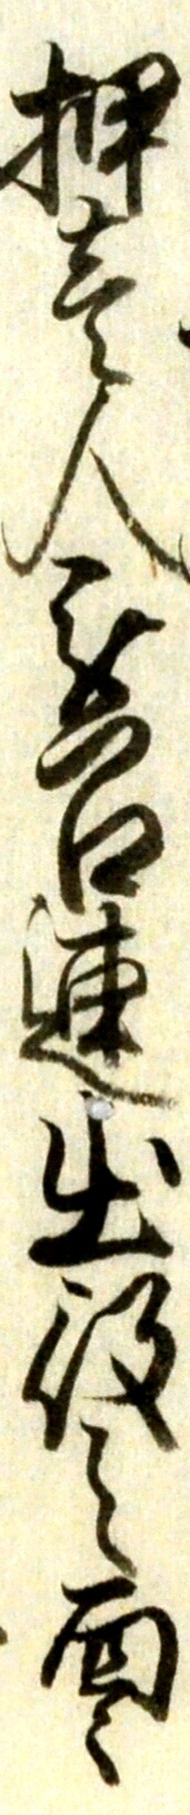押壱人被召連出役之面々
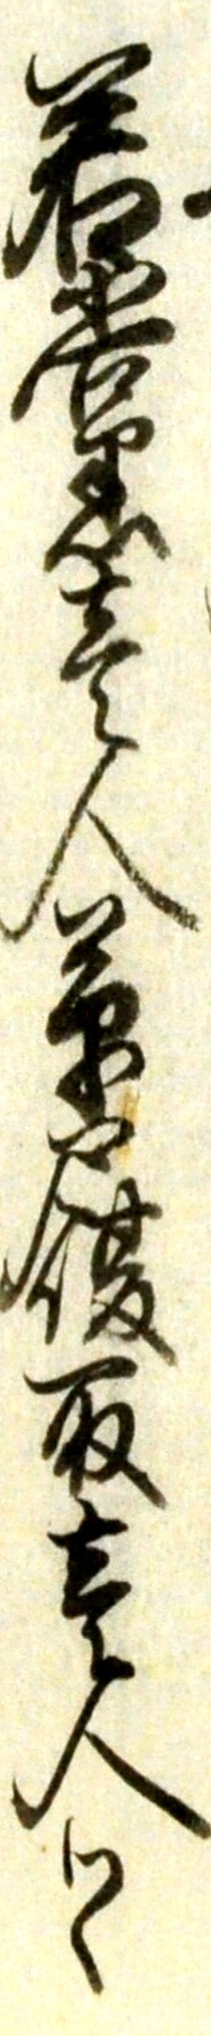若党壱人草履取壱人ツヽ
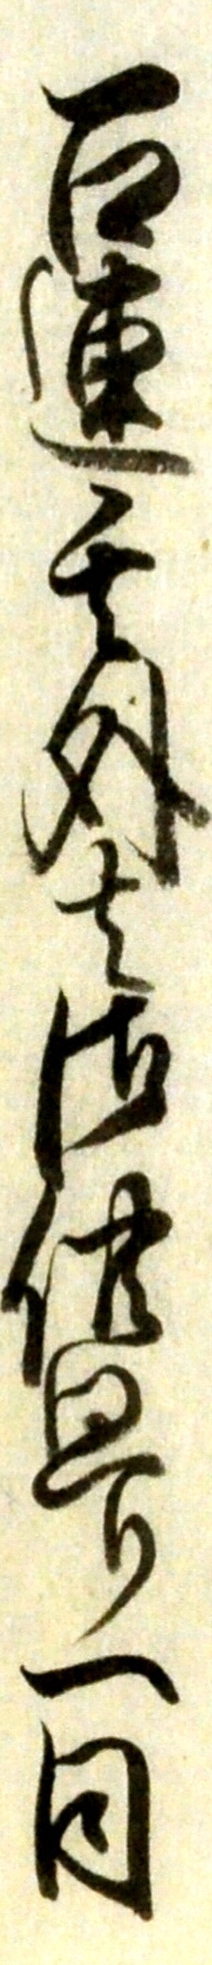召連其外は御供廻り一同
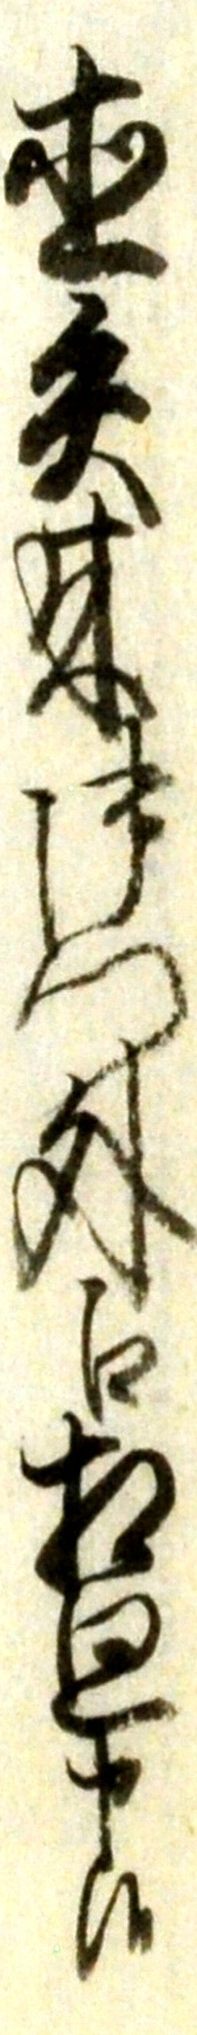直矢来御門外え相廻申候

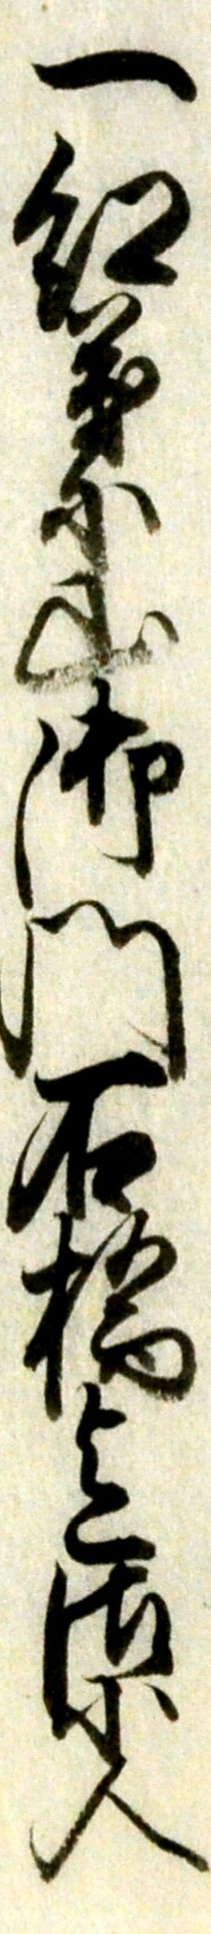一紅葉山御門石橋迄御小人
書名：紅葉山御見分ノ節ノ御書付
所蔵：伊那市立高遠町図書館・合同会社AMANE
